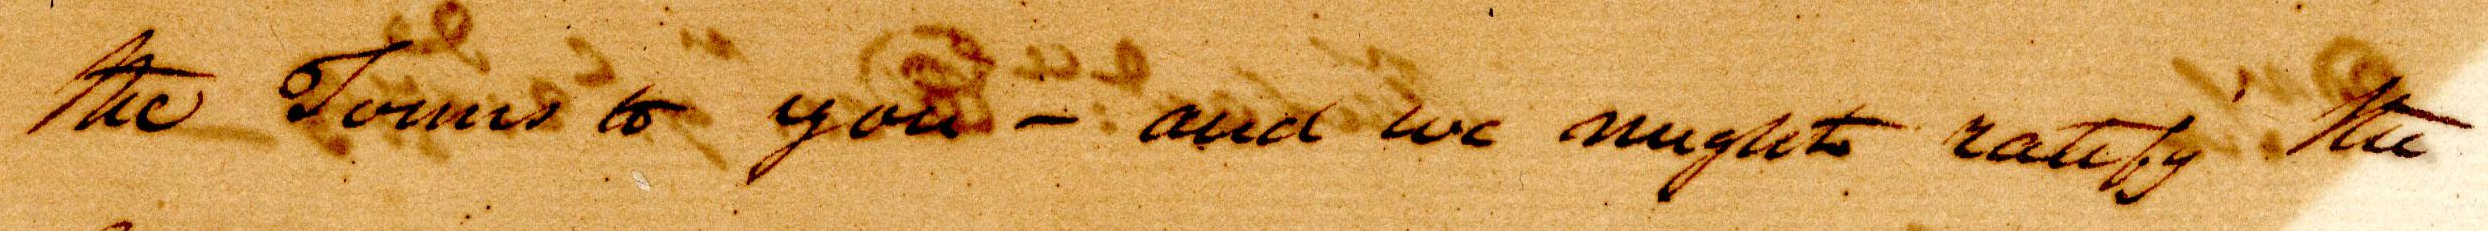the Terms to you- and we might ratify the
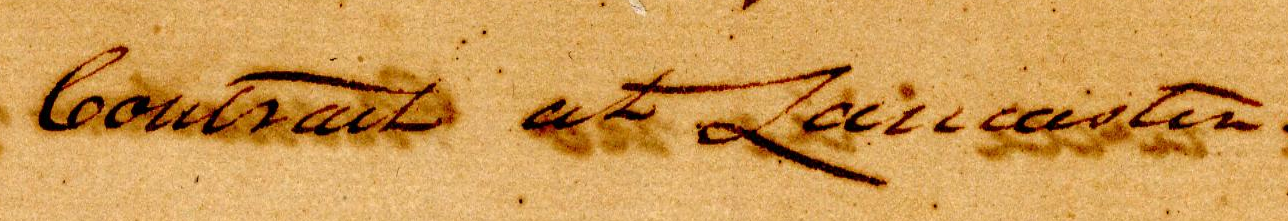Contract at Lancaster
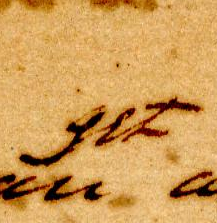get
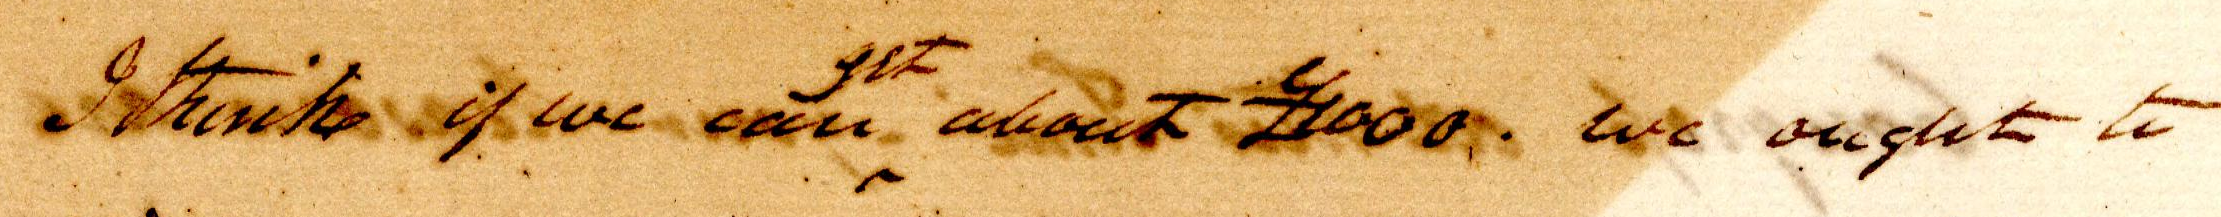I think if we can ^ about £1000. we ought to
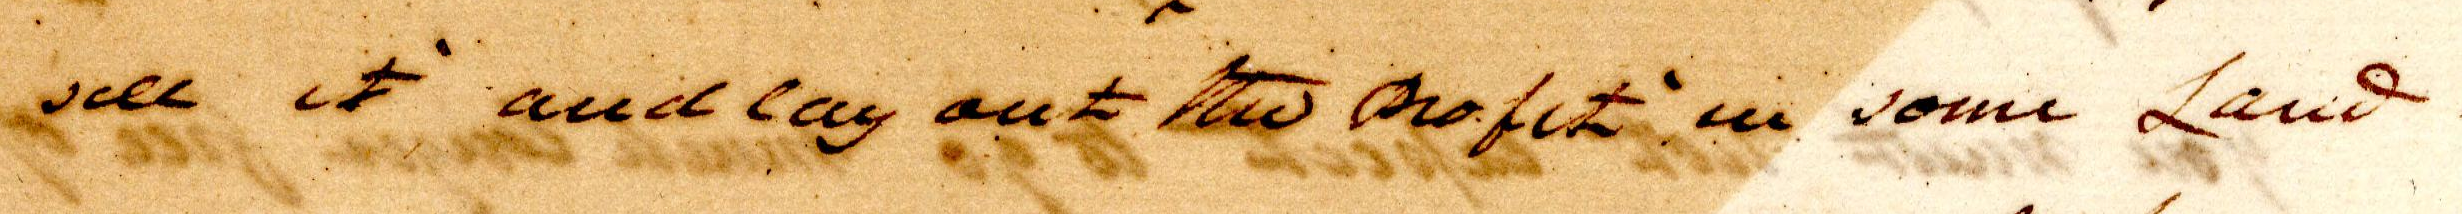sell it and lay out the Profit in some Land
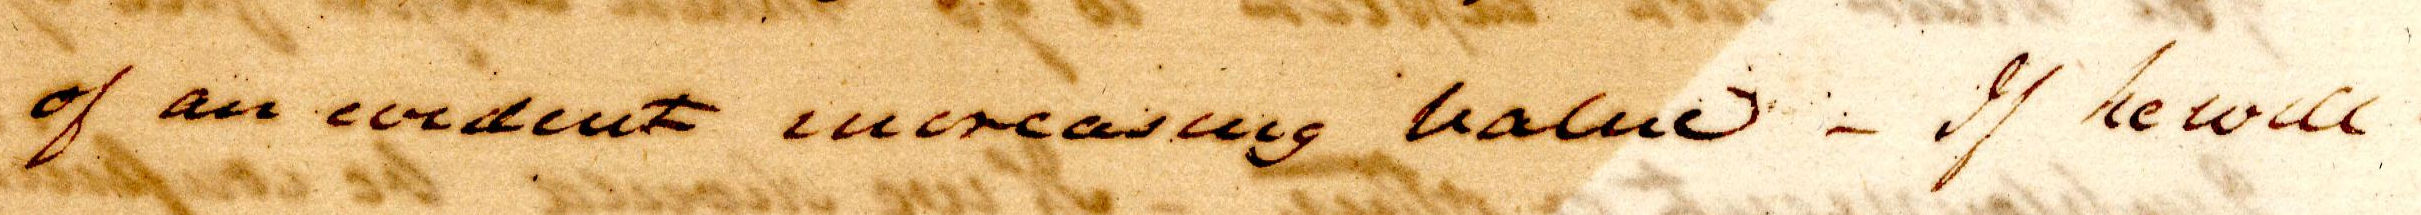of an evident increasing value- If he will
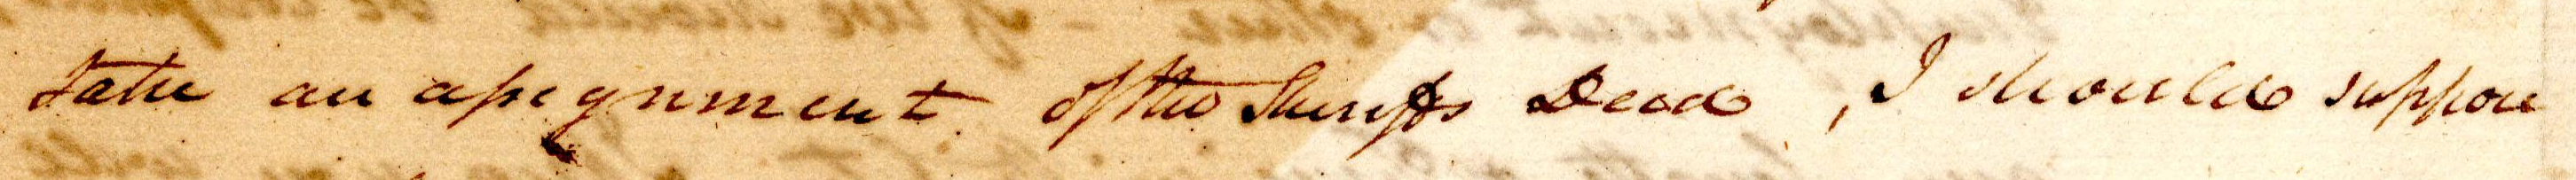take an assignment of the Shereds Deed, I should suppose
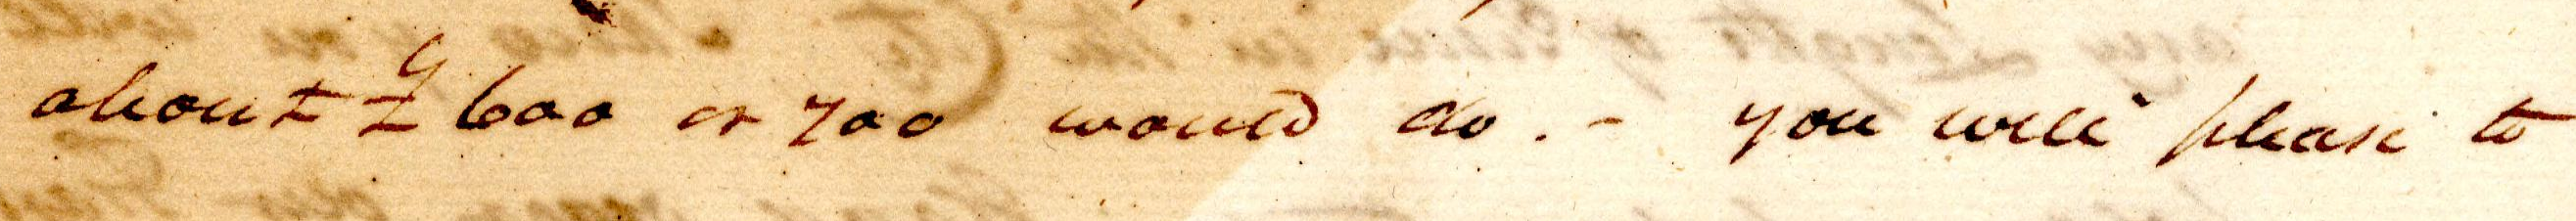about £600 or 700 would do. you will please to
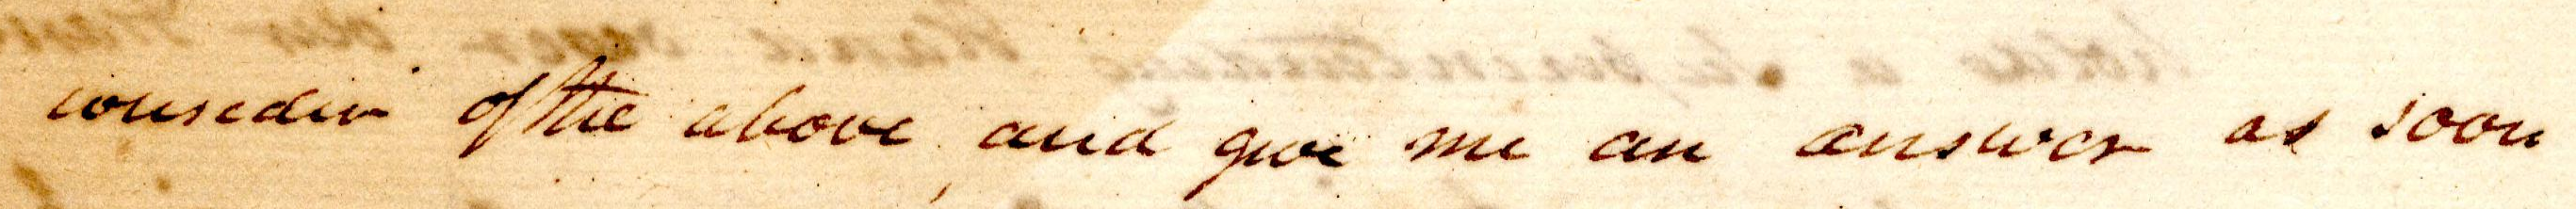consider of the above and give me an answer as soon
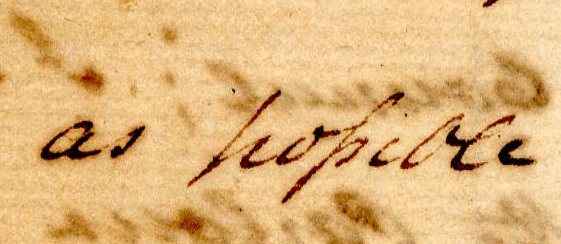as possible.
